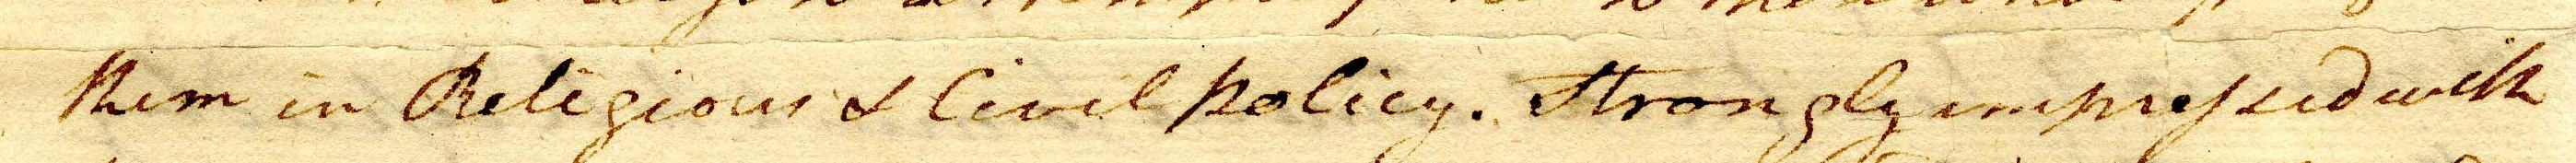them in Religious & Civil policy. Strongly impressed with
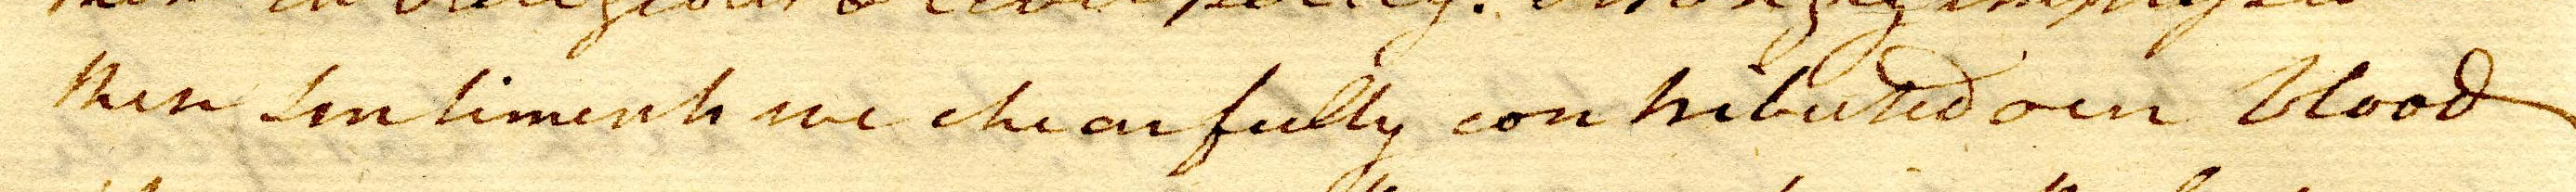these Sentiments we chearfully contributed our blood
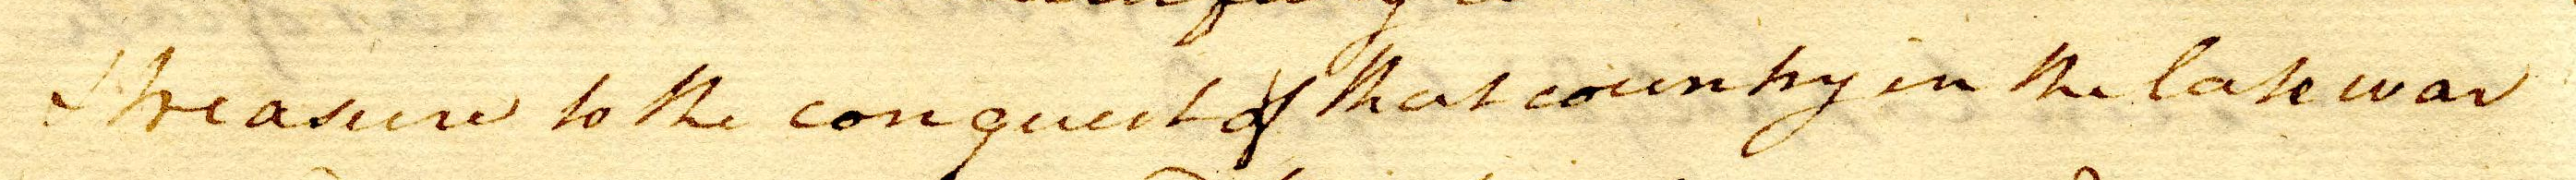& treasure to the conquest of that country in the late war
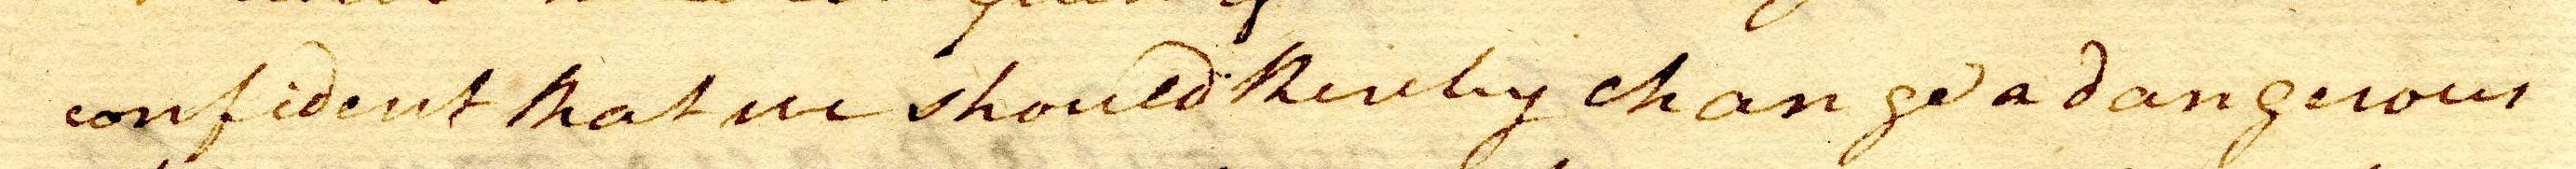confident that we should thereby change a dangerous
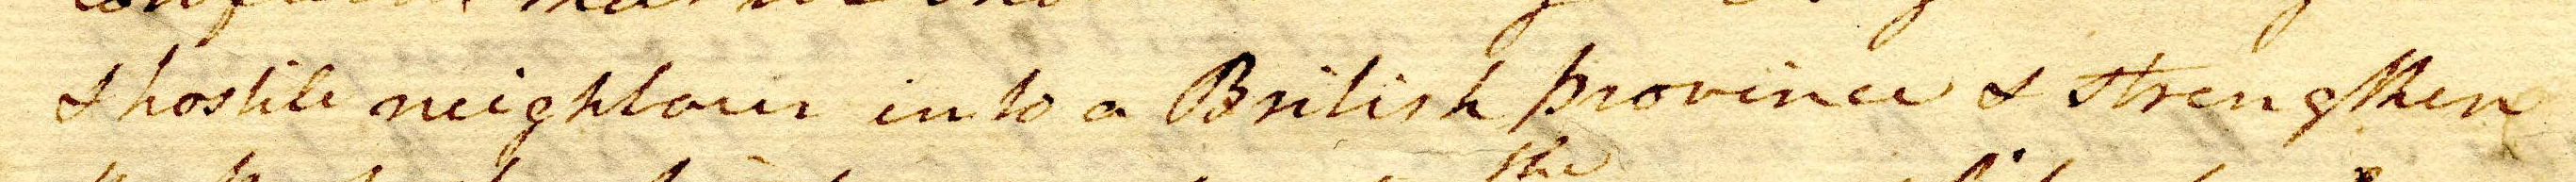& hostile neighbour into a British province & strengthen
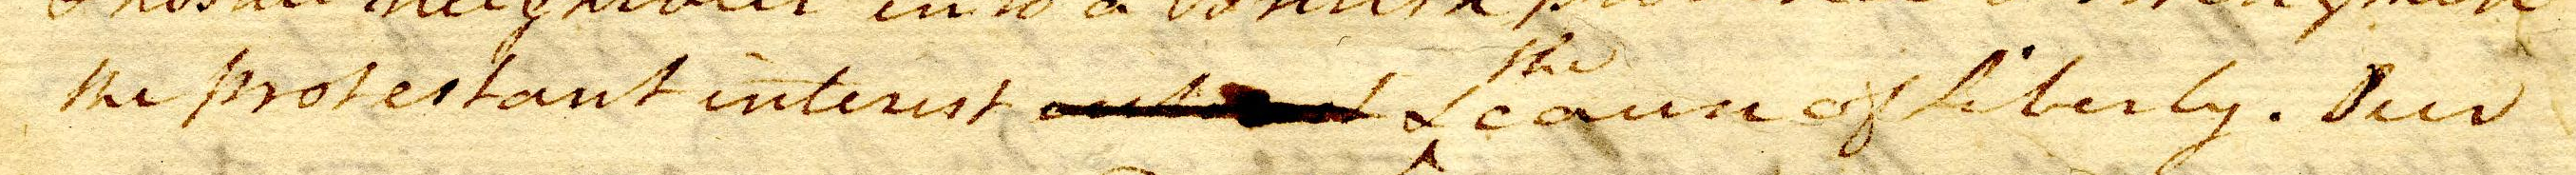the protestant interest & ^the cause of Liberty. Our
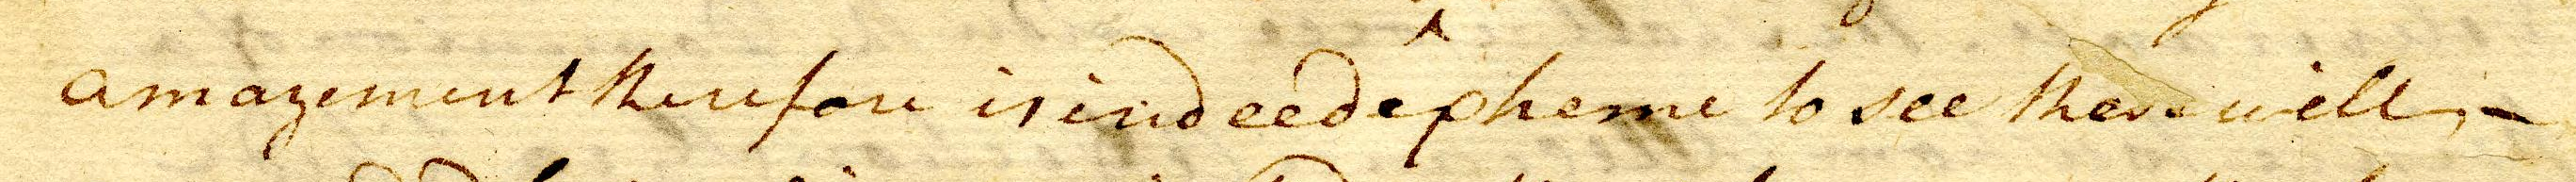amazement therefore is indeed extreme to see these well,-
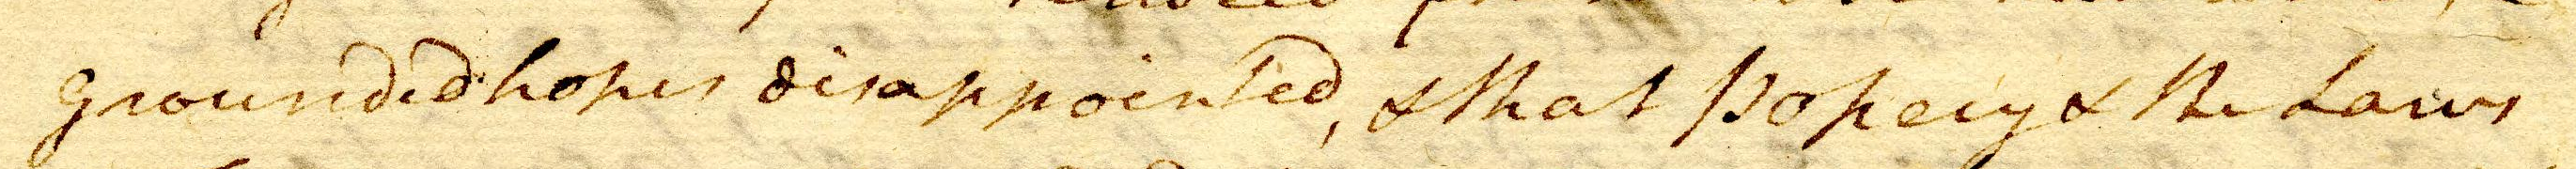grounded hopes disappointed, & that popery & the Laws
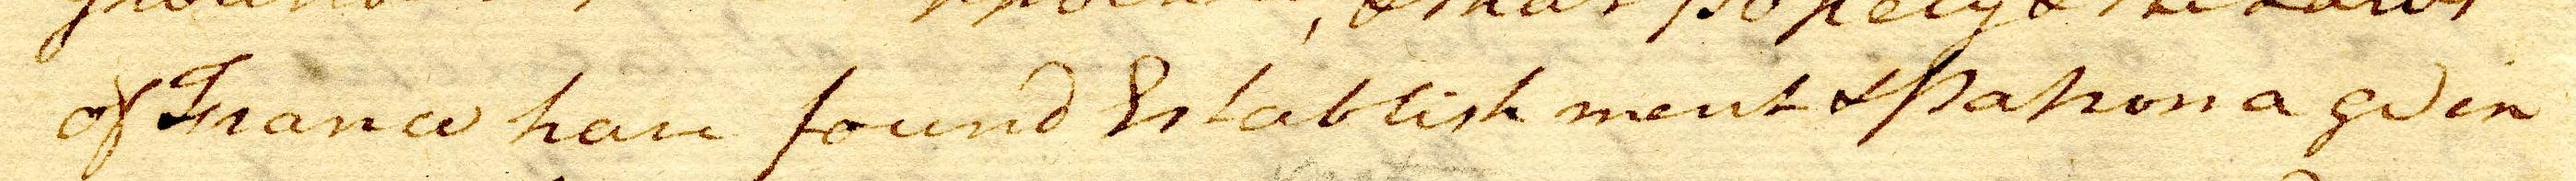of France have found Establishment & patronage in
